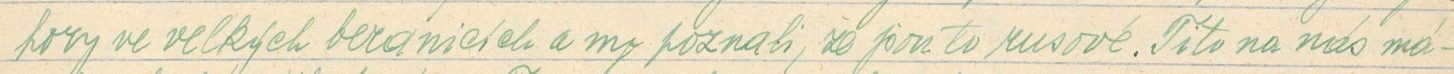hory ve velkých beranicích a my poznali, že jsou to rusové. Tito na nás má-
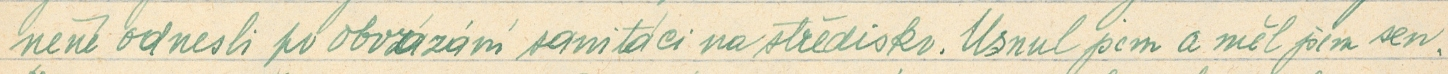něné odnesli po obvzázání sanitáci na středisko. Usnul jsem a měl jsem sen.
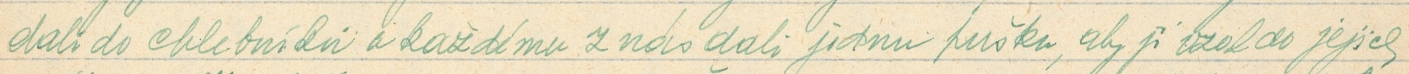dali do chlebníků a každému z nás dali jednu pušku, aby jí vzal do jejich
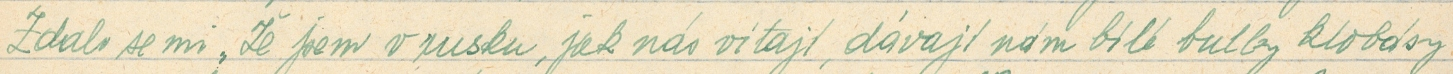Zdalo se mi, že jsem v rusku, jak nás vítají, dávají nám bílé bulky klobásy
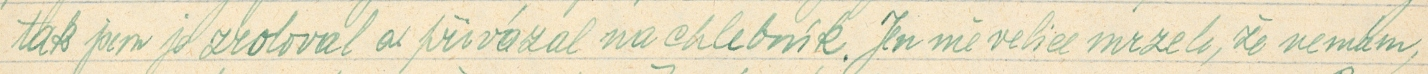tak jsem je zroloval a přivázal na chlebník. Jen mě velice mrzelo, že nemám
